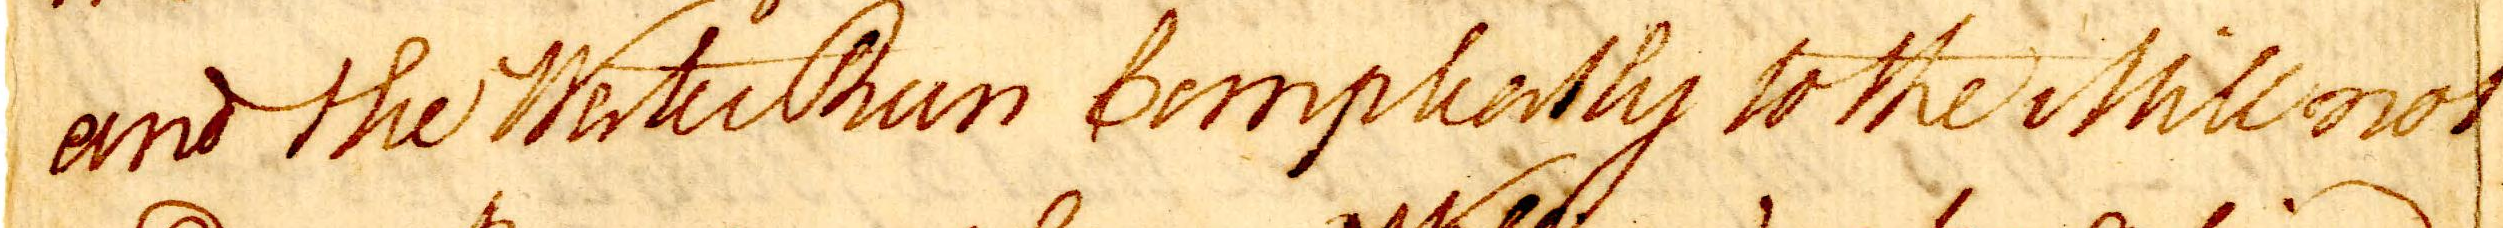and the Water Run Compleatly to the Mill not
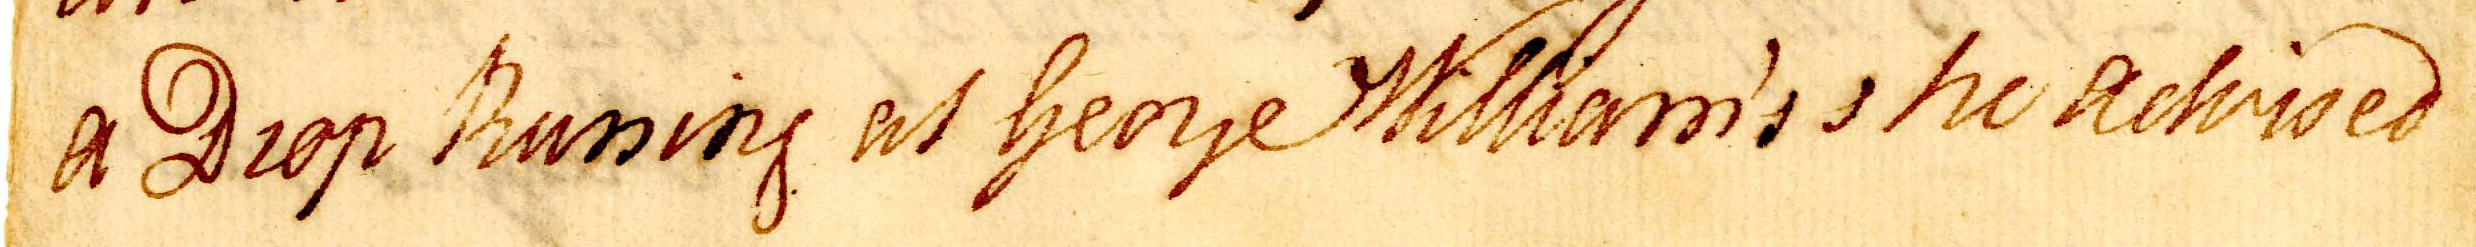a Drop Runing as George William's she advised
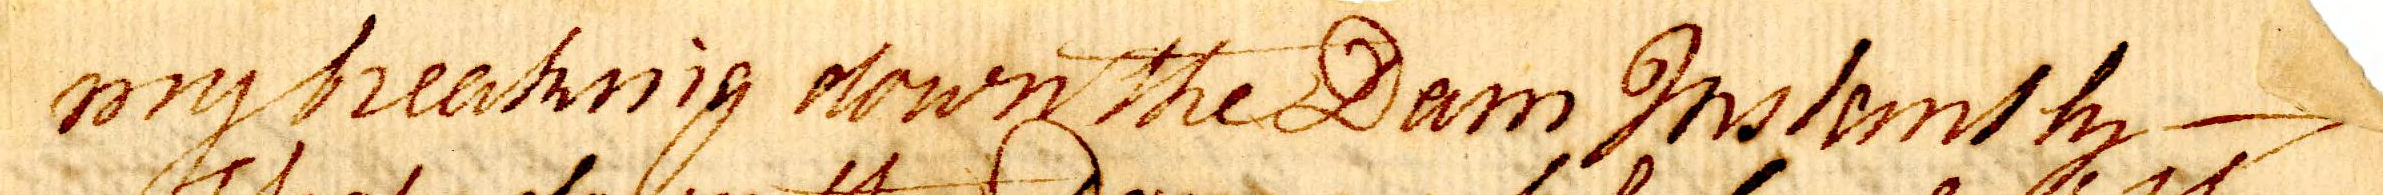my breaking down the Dam Instantly-
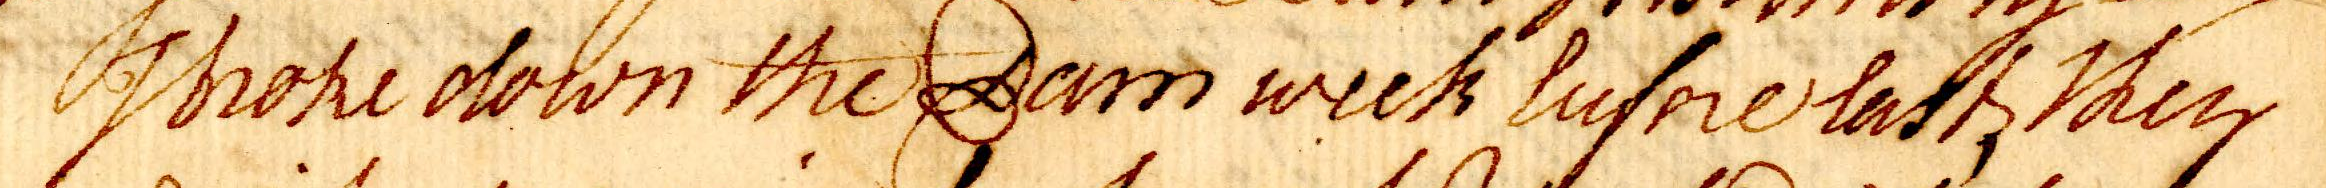I broke down the Dam week before last they
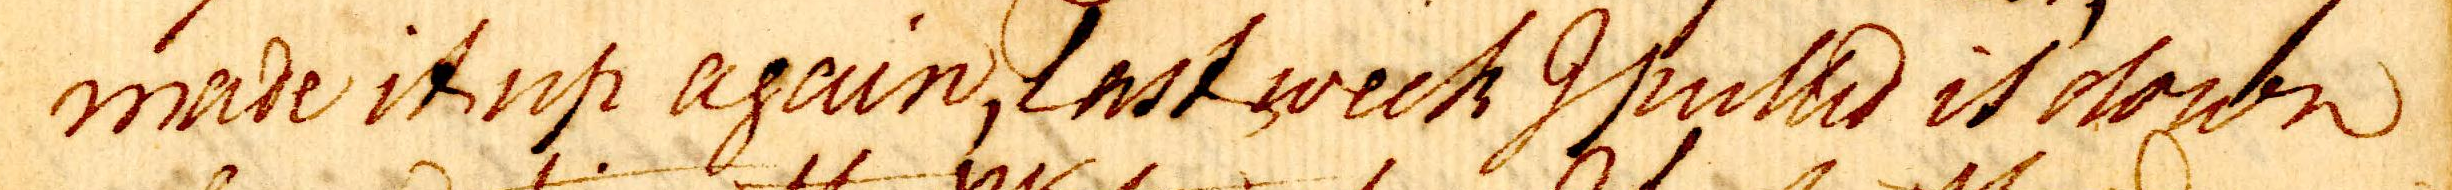made it uup again, last week I pulled it down
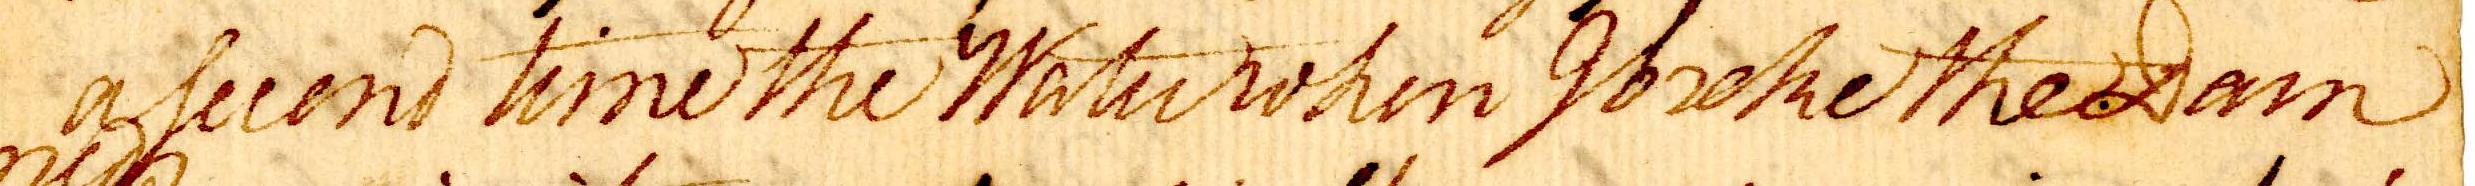a second time the Water when I broke the Dam
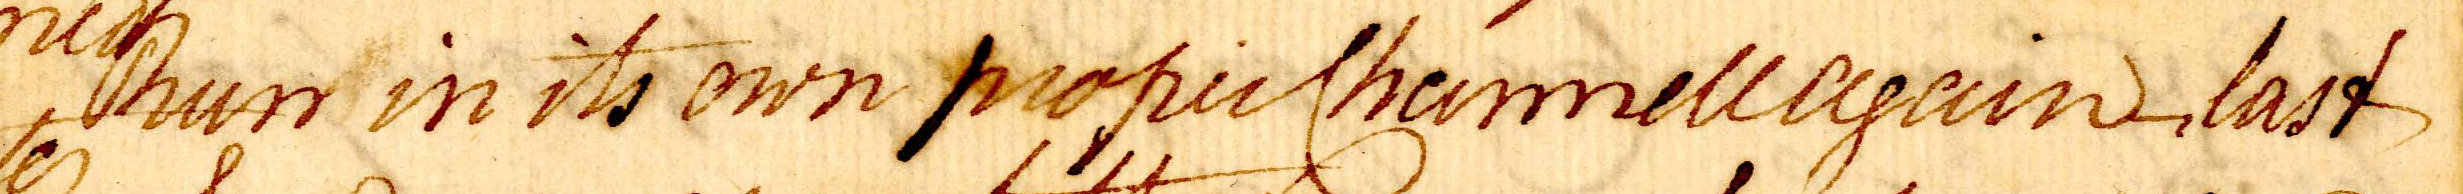Run in its own proper Channell again. last
